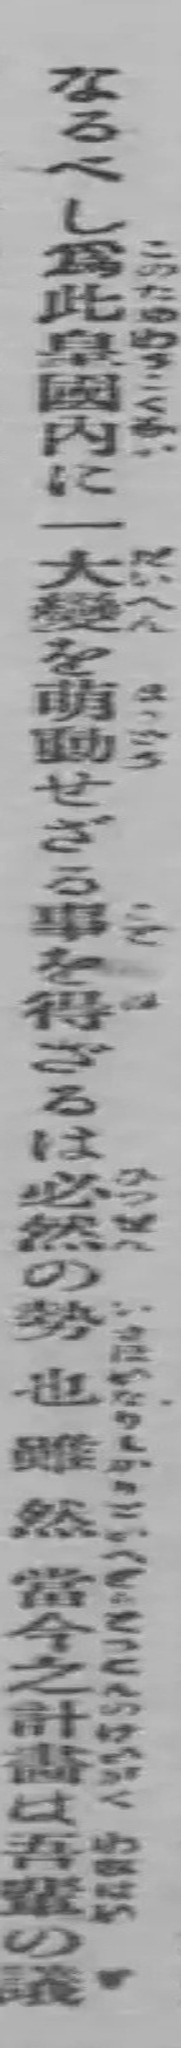なるべし為此皇国内に一大変を萌動せざる事を得ざるは必然の勢也雖然当今之計画は吾輩の議
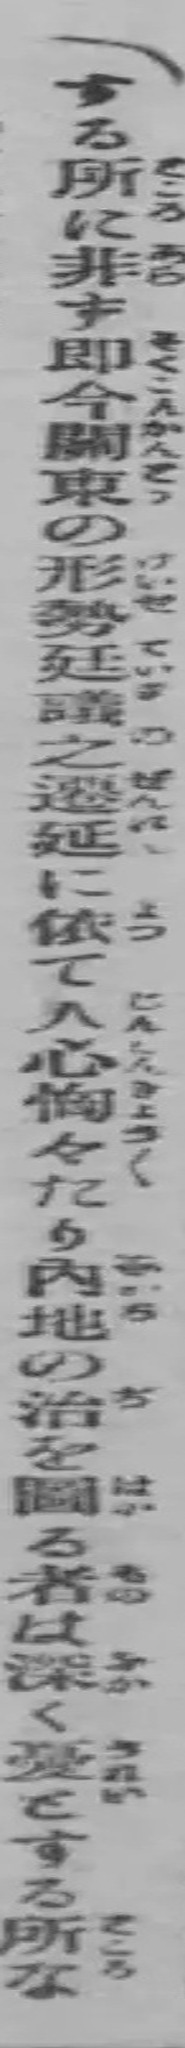する所に非ず即今関東の形勢廷議之遷延に依て人心恟々たり内地の治を図る者は深く憂とする所な
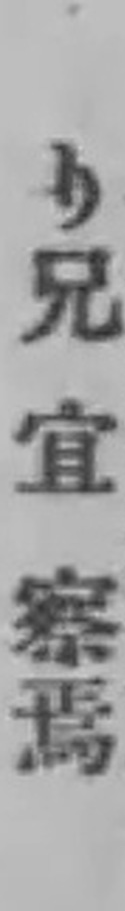り兄宜察焉
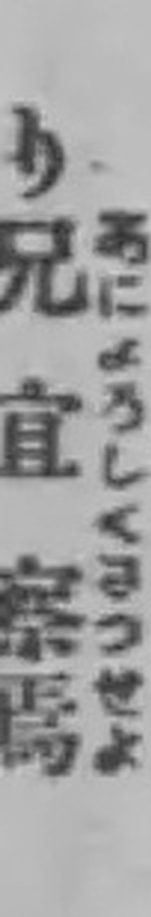り兄宜察焉
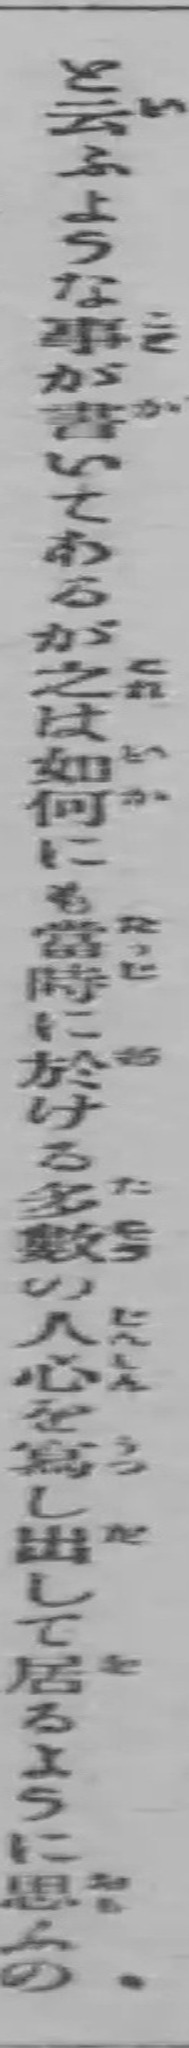と云ふような事が書いてあるが之は如何にも当時に於ける多数の人心を写し出して居るように思ふの
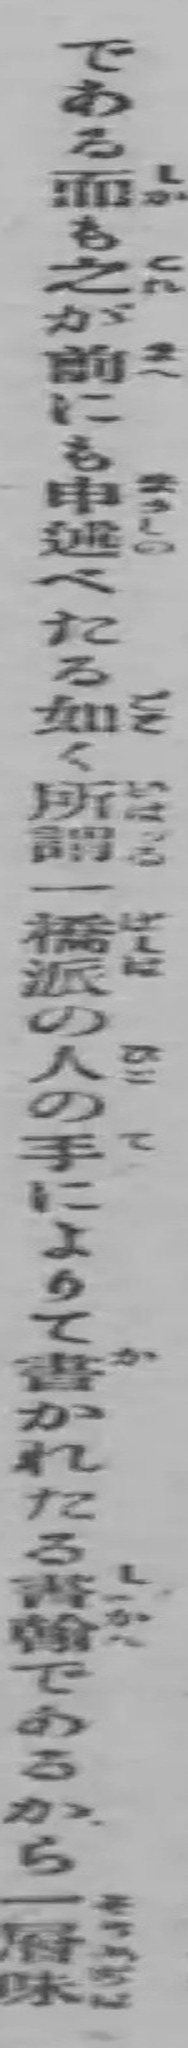である而も之が前にも申述べたる如く所謂一橋派の人の手によりて書かれたる書翰であるから一層味
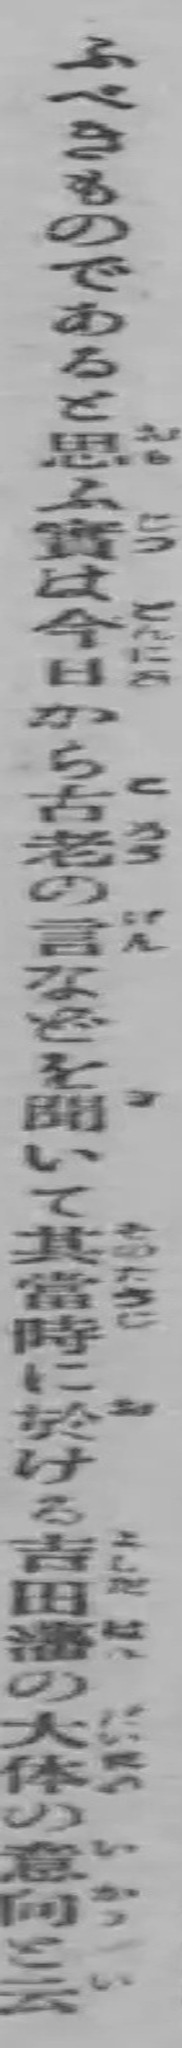ふべきものであると思ふ実は今日から古老の言などを聞いて其当時に於ける吉田藩の大体の意向と云
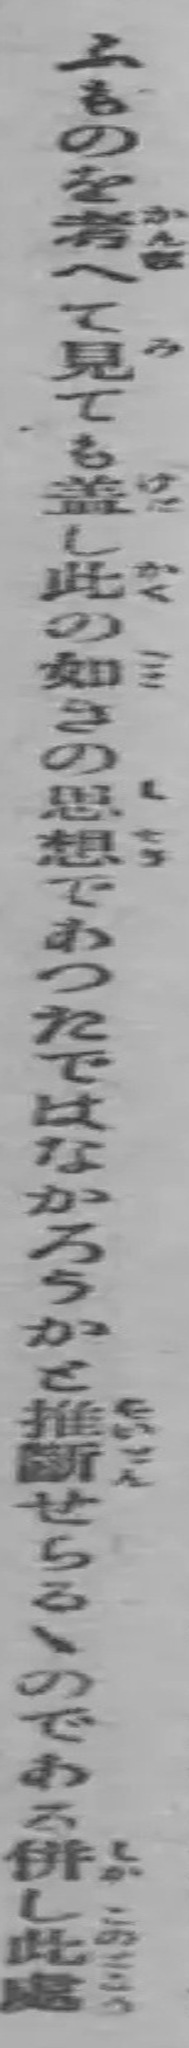ふものを考へて見ても蓋し此の如きの思想であつたではなかろうかと推断せらるゝのである併し此処

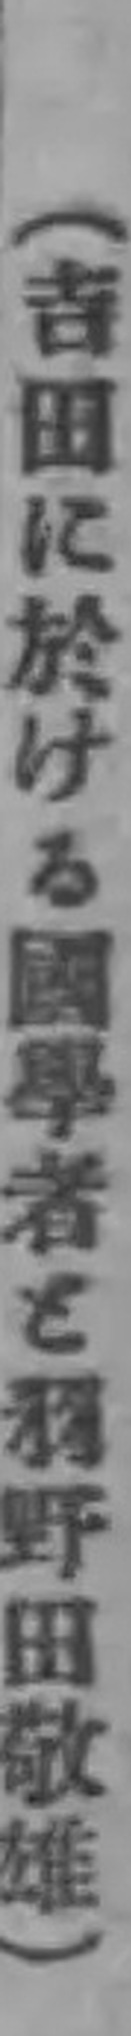⦿吉田に於ける国学者と羽田野敬雄
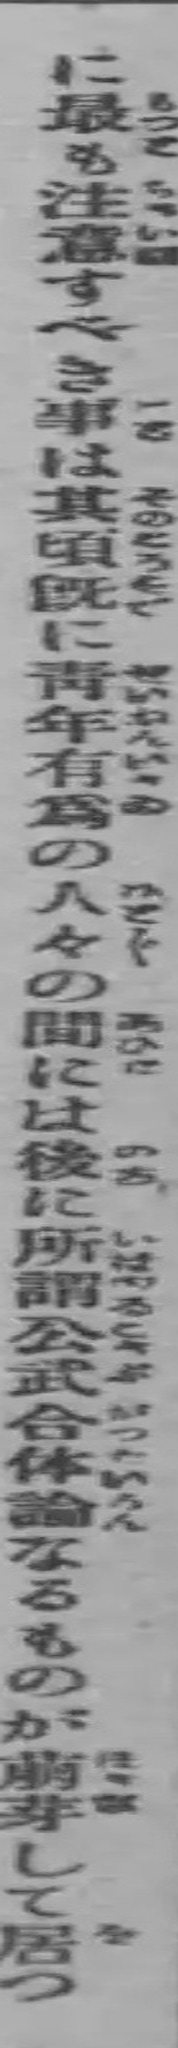に最も注意すべき事は其頃既に青年有為の人々の間には後に所謂公武合体論なるものが萌芽して居つ
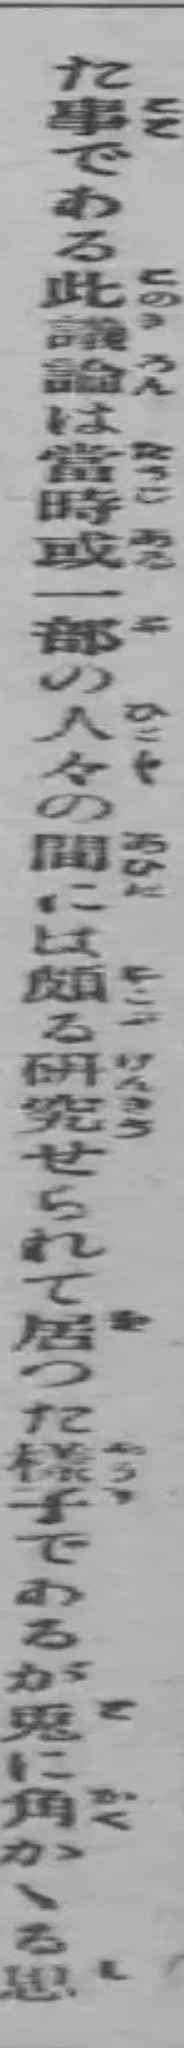た事である此議論は当時或一部の人々の間には頗る研究せられて居つた様子であるが兎に角かゝる思
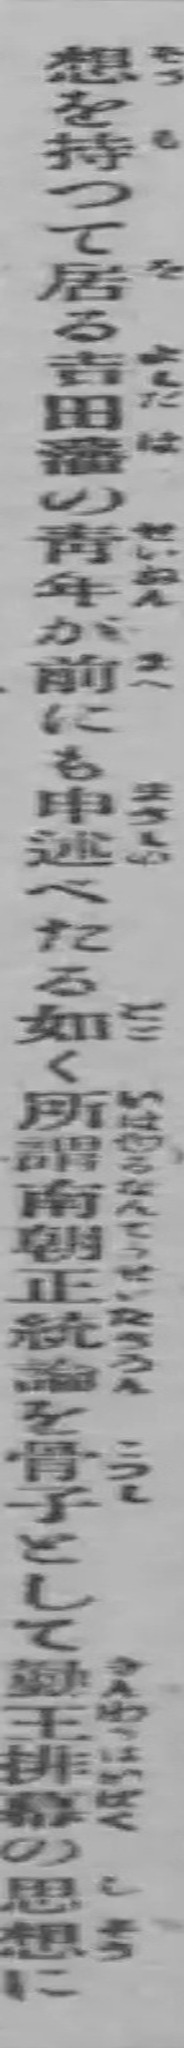想を持つて居る吉田藩の青年が前にも申述べたる如く所謂南朝正統論を骨子として勤王排幕の思想に
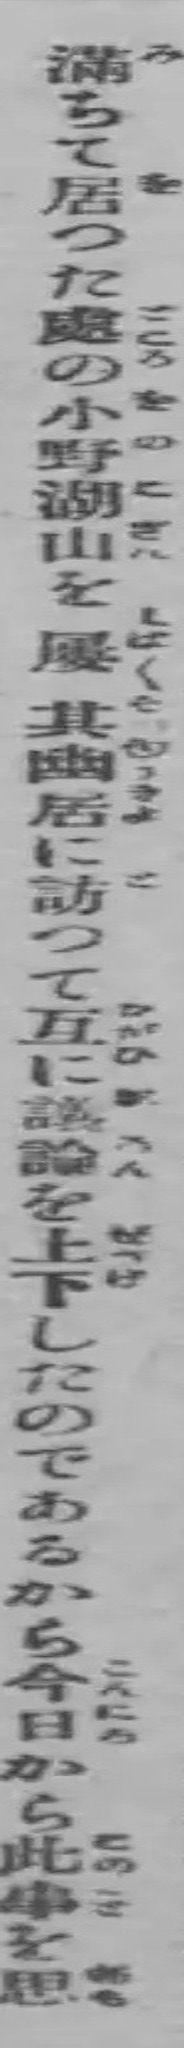満ちて居つた処の小野湖山を屡其幽居に訪つて互に議論を上下したのであるから今日から此事を思
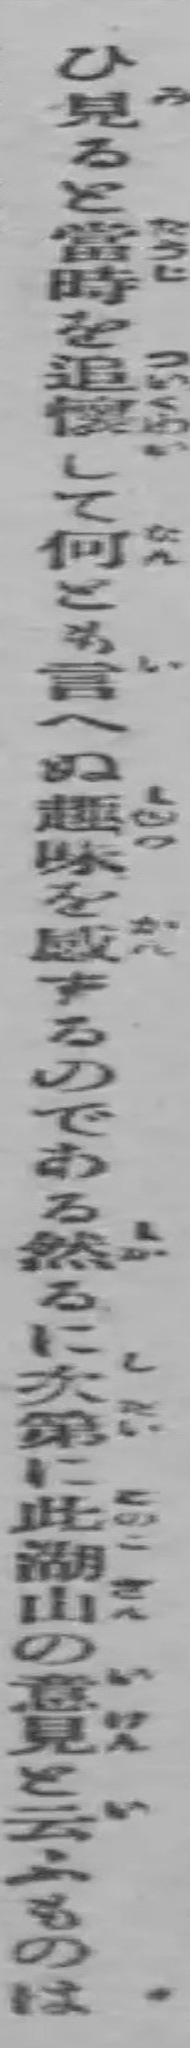ひ見ると当時を追懐して何とも言へぬ趣味を感ずるのである然るに次第に此湖山の意見と云ふものは
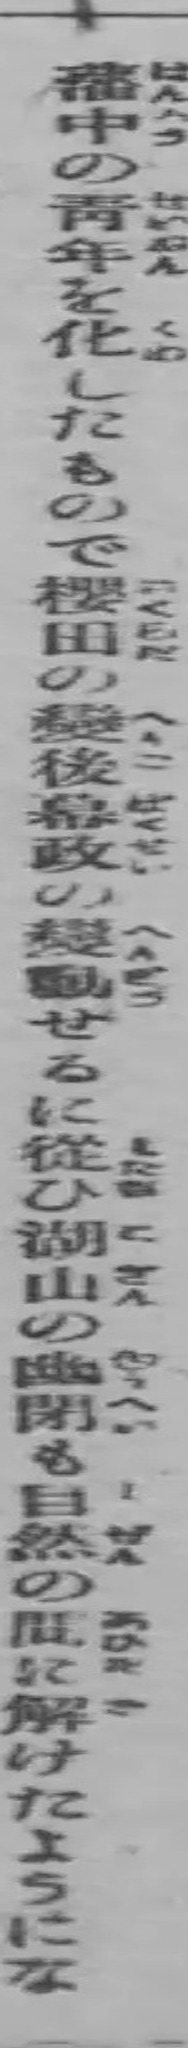藩中の青年を化したもので桜田の変後幕政の変動せるに従ひ湖山の幽閉も自然の間に解けたようにな
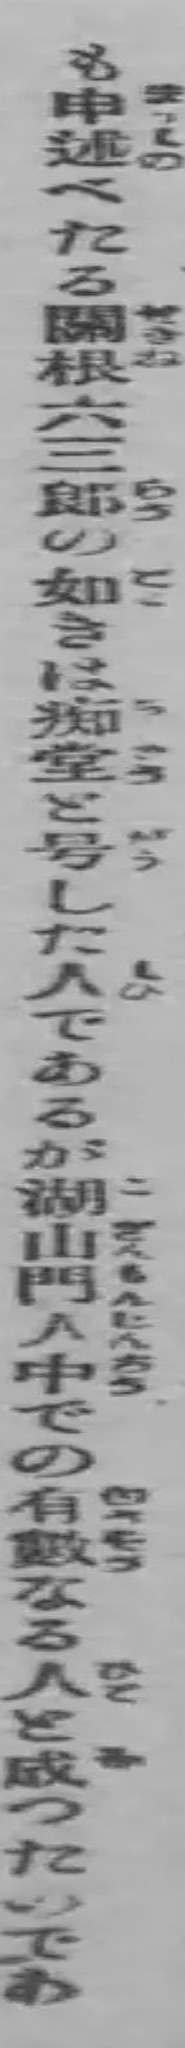も申述べたる関根六三郎の如きは痴堂と号した人であるが湖山門人中での有数なる人と成つたのであ
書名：豊橋市史談
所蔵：国立国会図書館 National Diet Library, JAPAN
